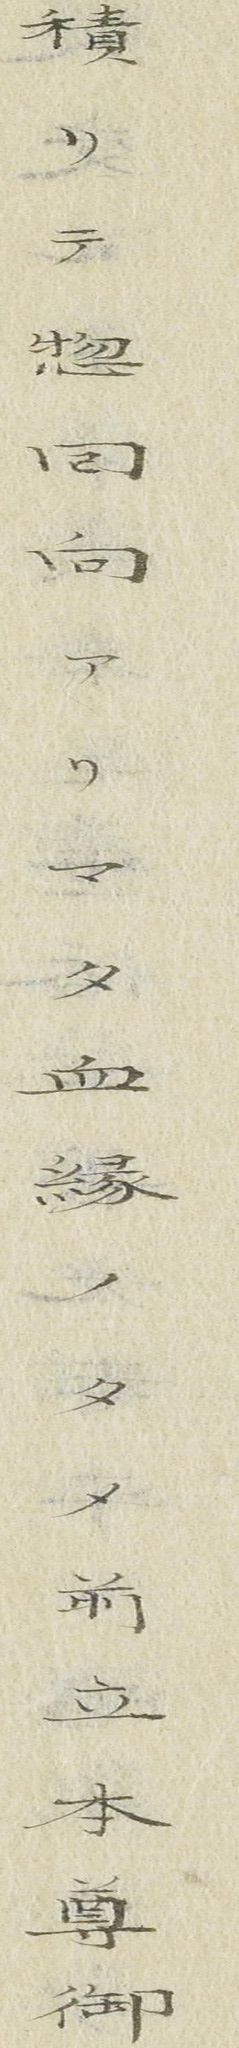積リテ惣回向アリマタ血縁ノタメ前立本尊御
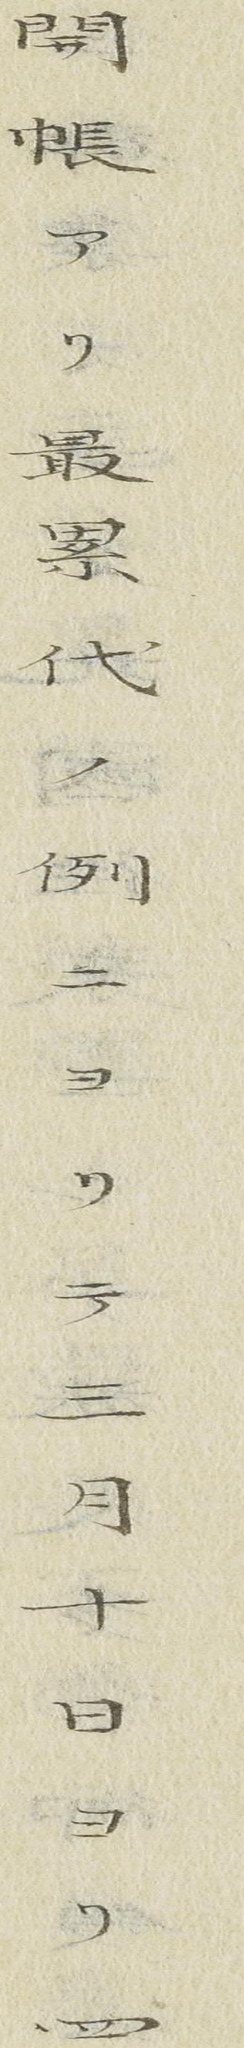開帳アリ最累代ノ例ニヨリテ三月十日ヨリ四
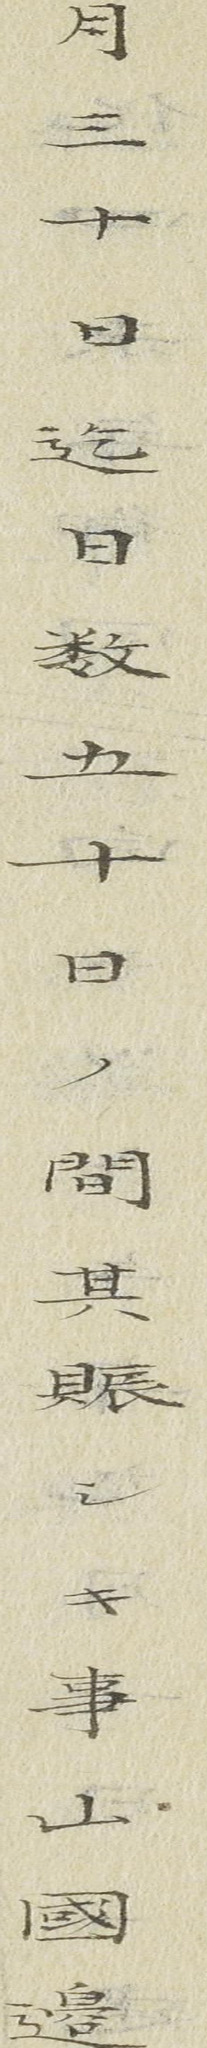月三十日迄日数五十日ノ間其賑シキ事山国辺
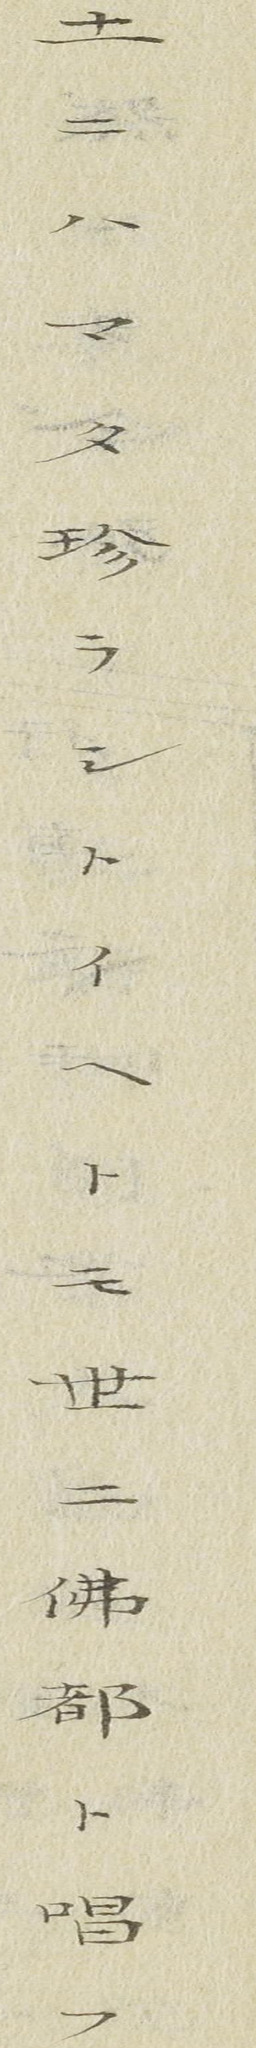土ニハマタ珍タシトイヘトモ世ニ仏都ト唱フ
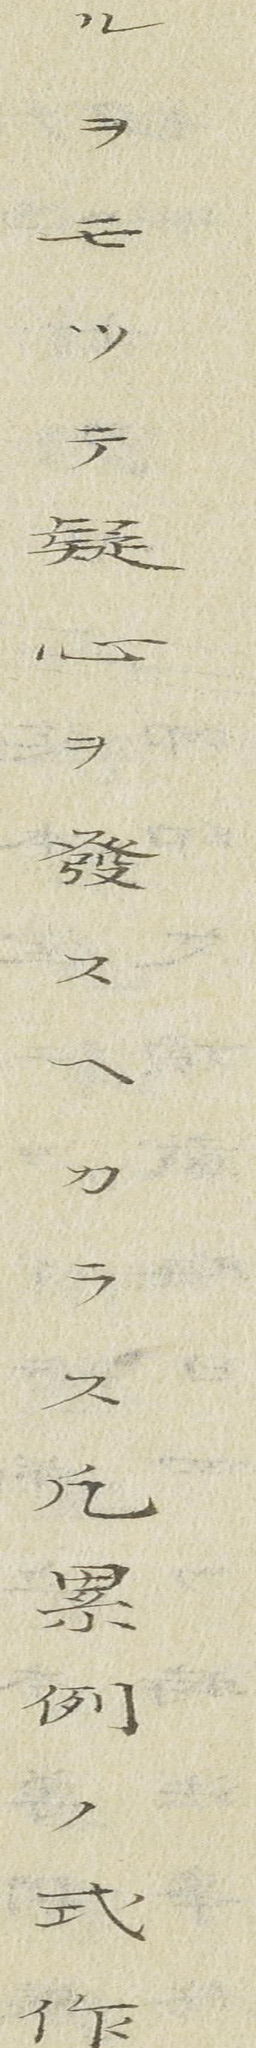ルヲモツテ疑心ヲ発スヘカラズ凡累例ノ式作
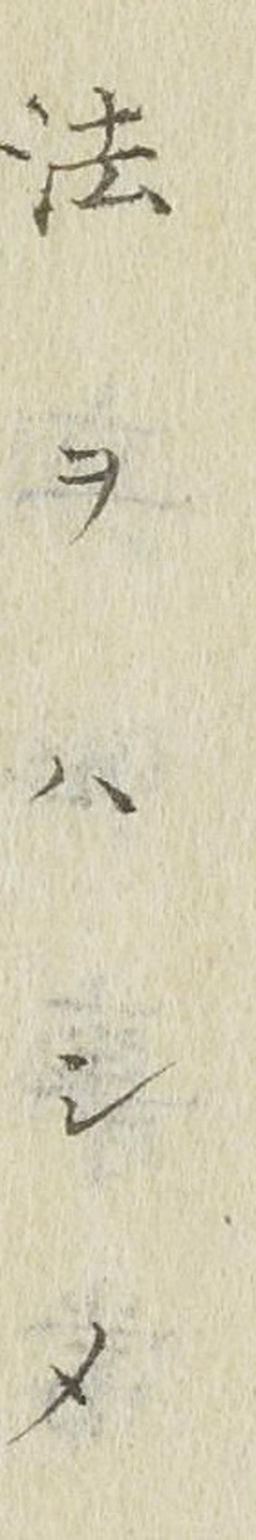法ヲハシメ

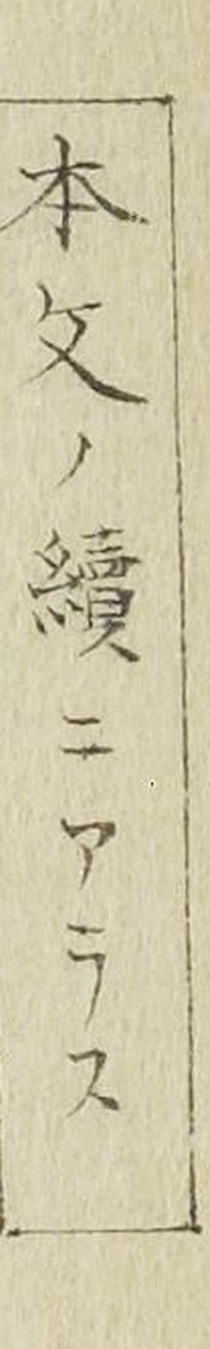本文ノ続ニアラス
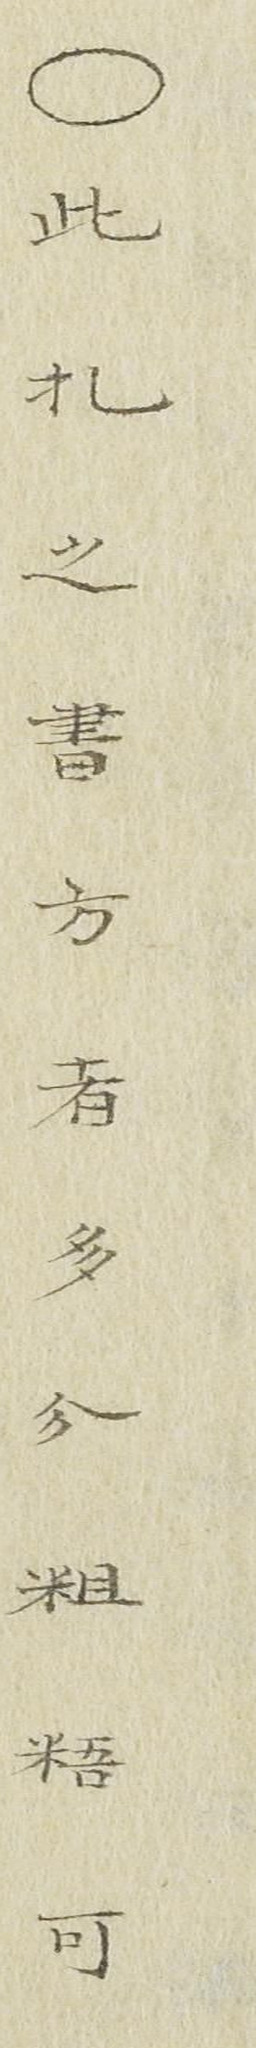〇此札之書方者多分粗語可
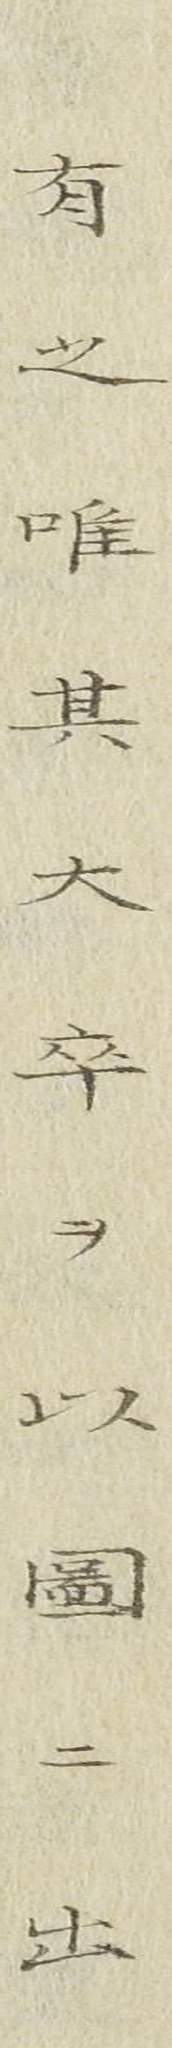有之唯其大卒ヲ以図ニ出
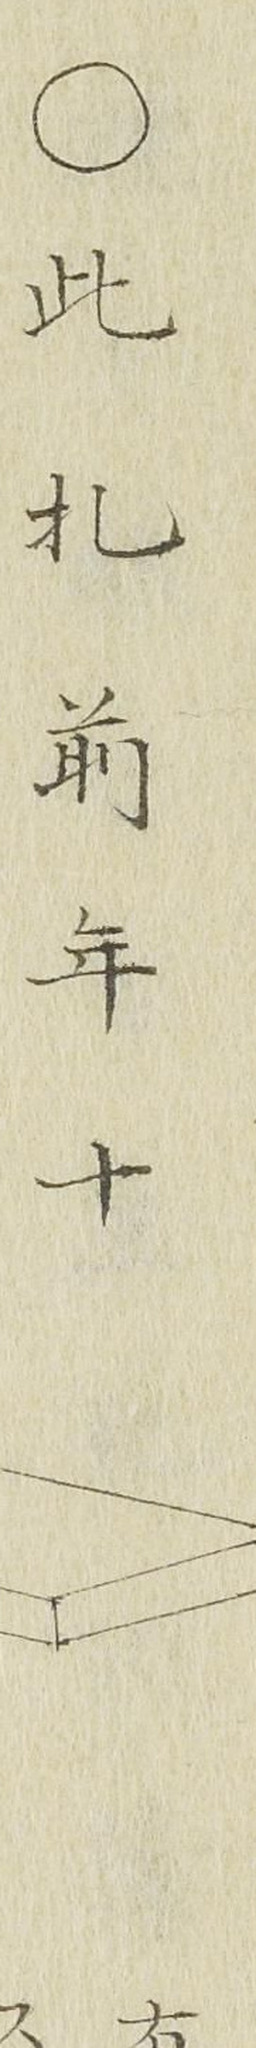〇此札前年十
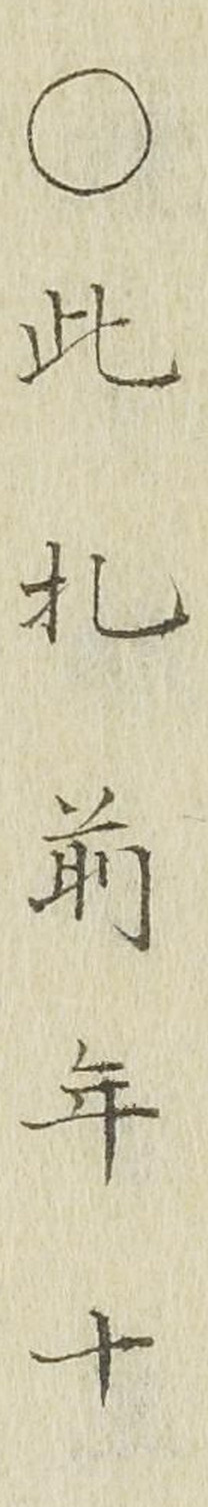〇此札前年十
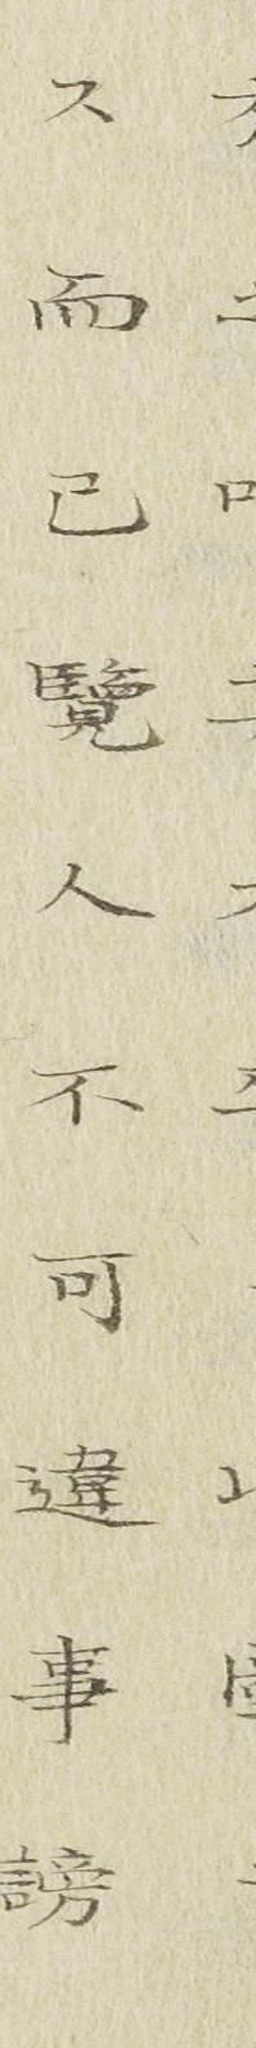ス而己覧人不可違事謗
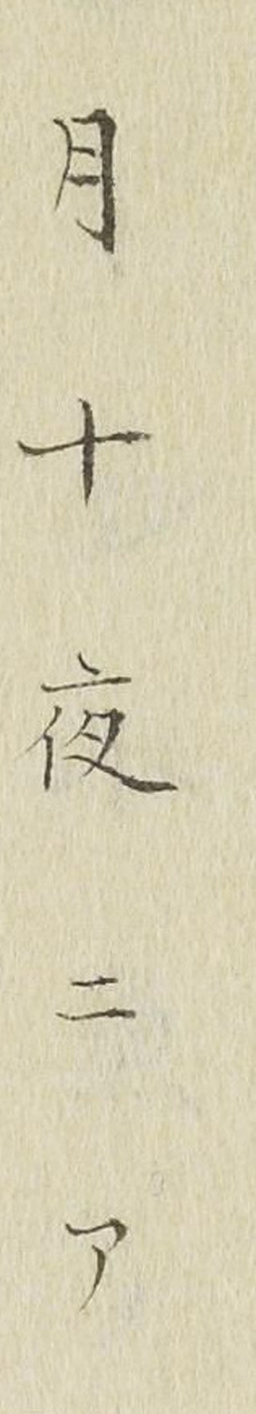月十夜ニア
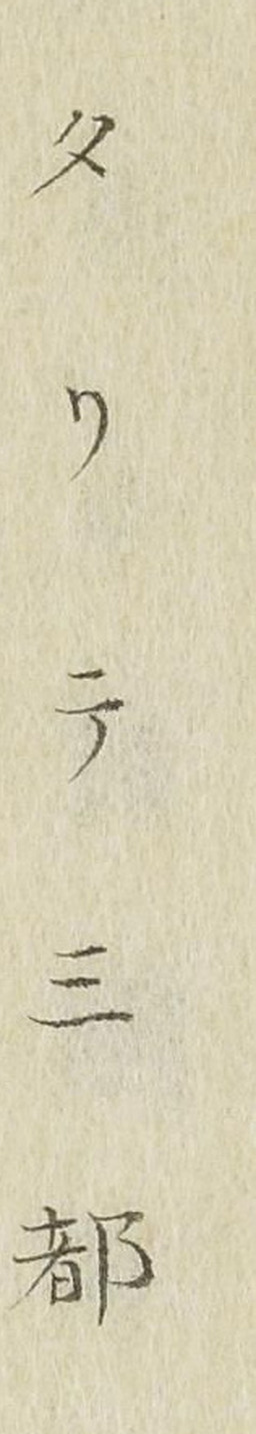タリテ三都
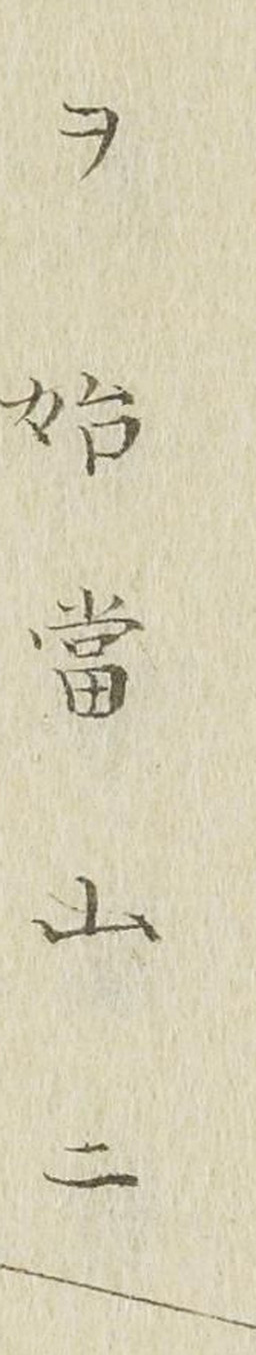ヲ始当山ニ
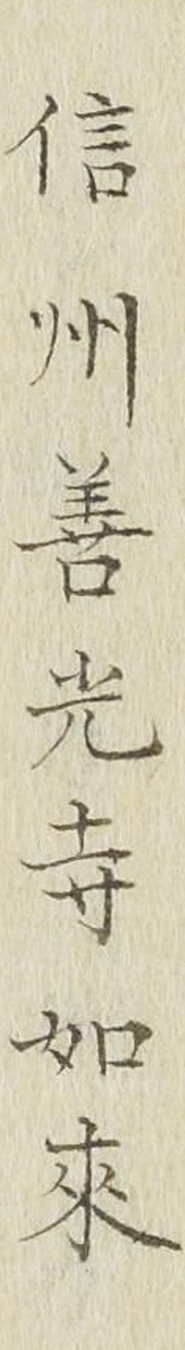信州善光寺如来
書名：地災撮要　地震之部　巻ノ二
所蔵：東京大学地震研究所図書室 Earthquake Research Institute Library, The University of Tokyo, JAPAN
